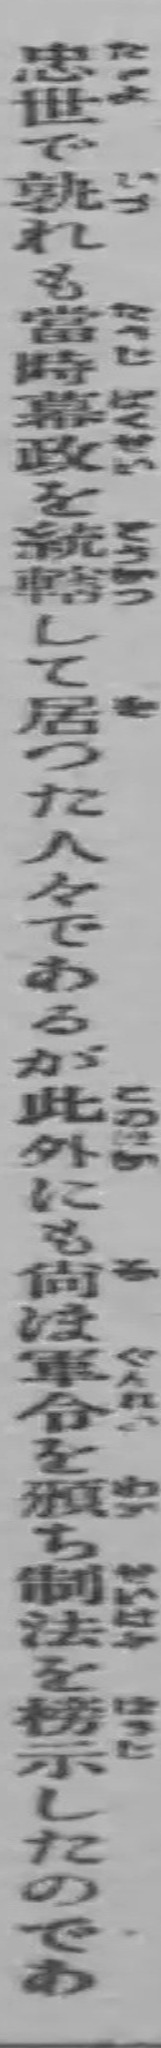忠世で孰れも当時幕政を統括して居つた人々であるが此外にも尚ほ軍令を頒ち制法を榜示したのであ
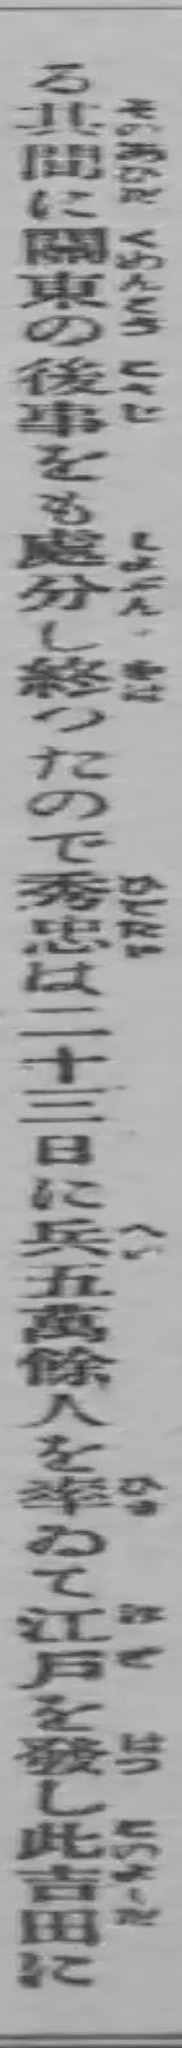秀忠の出発る其間に関東の後事をも処分し終つたので秀忠は二十三日に兵五万余人を率ゐて江戸を発し此吉田に
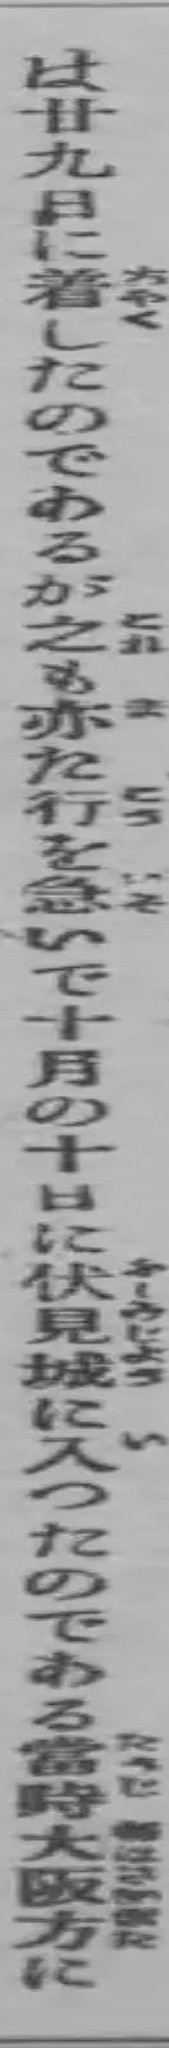は廿九日に着したのであるが之も亦た行を急いで十月の十日に伏見城に入つたのである当時大阪方に
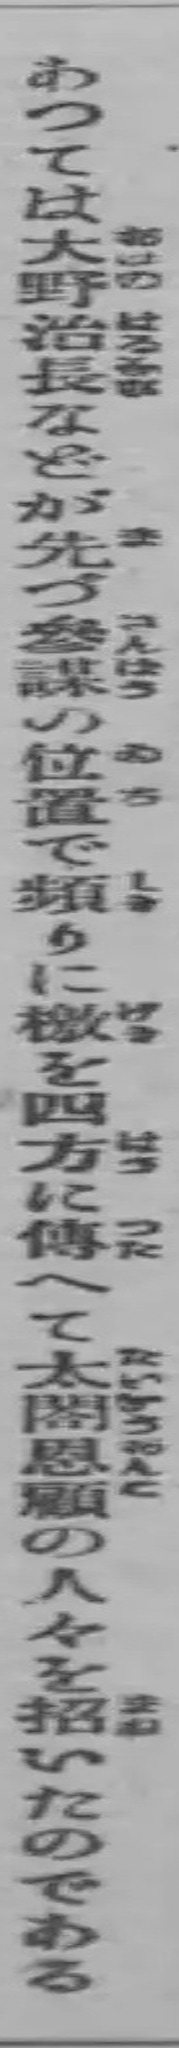あつては大野治長などが先づ参謀の位置で頻りに檄を四方に伝へて太閤恩顧の人々を招いたのである
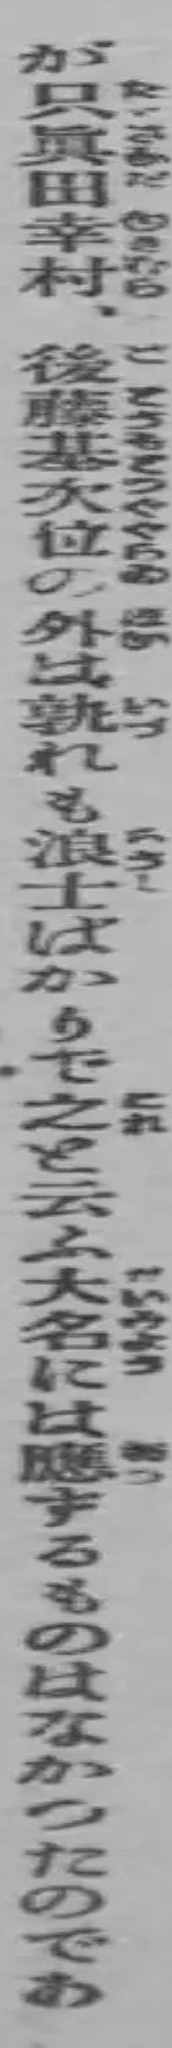が只真田幸村、後藤基次位の外は孰れも浪士ばかりで之と云ふ大名には応ずるものはなかつたのであ
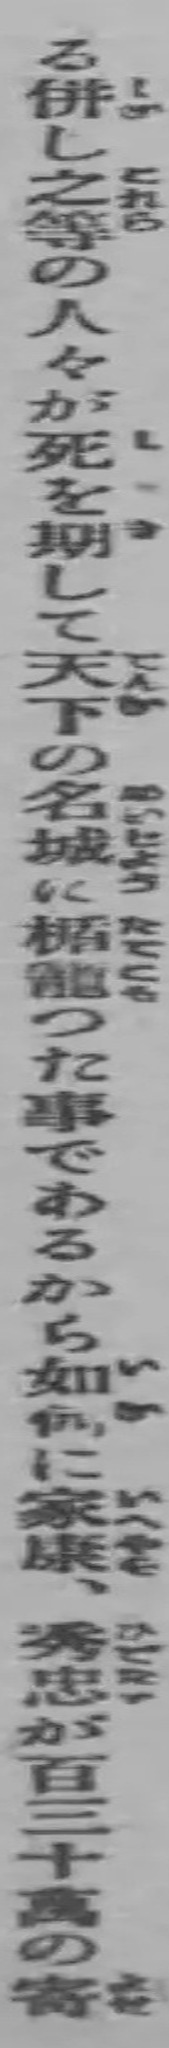る併し之等の人々が死を期して天下の名城に楯籠つた事であるから如何に家康、秀忠が百三十万の寄
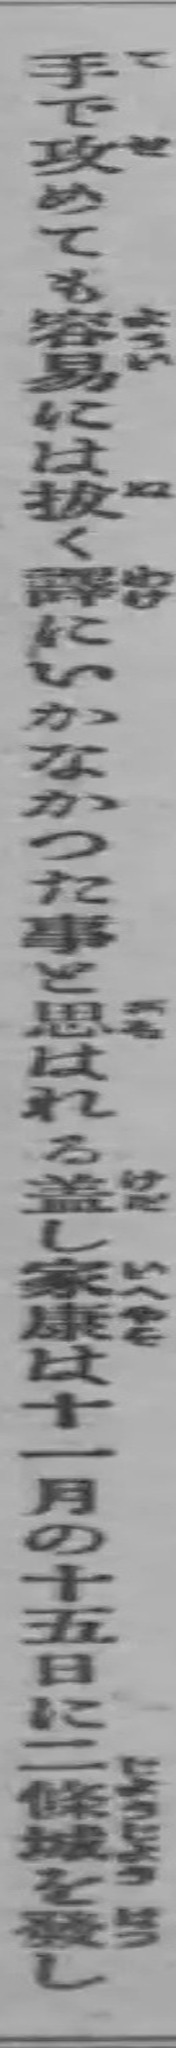手で攻めても容易には抜く訳にいかなかつた事と思はれる蓋し家康は十一月の十五日に二条城を発し

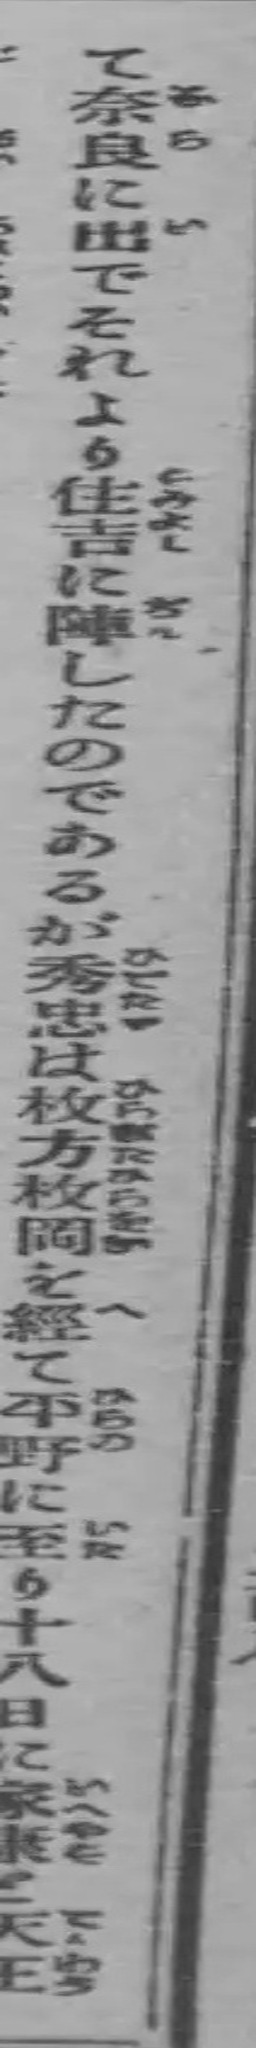て奈良に出でそれより住吉に陣したのであるが秀忠は枚方枚岡を経て平野に至り十八日に家康と天王
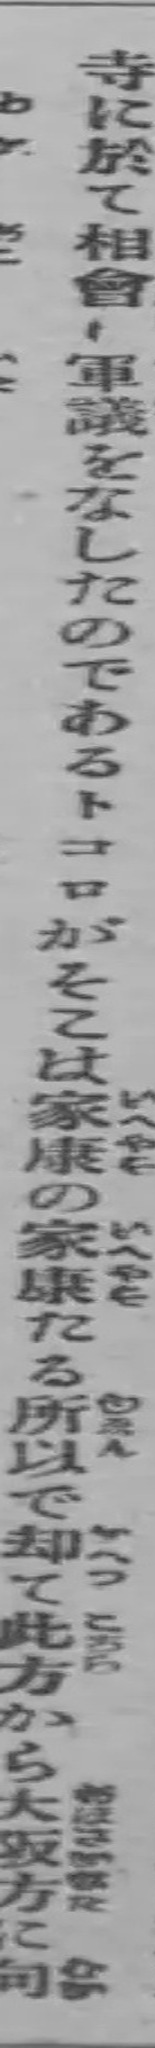寺に於て相会し軍議をなしたのであるトコロがそこは家康の家康たる所以で却て此方から大阪方に向
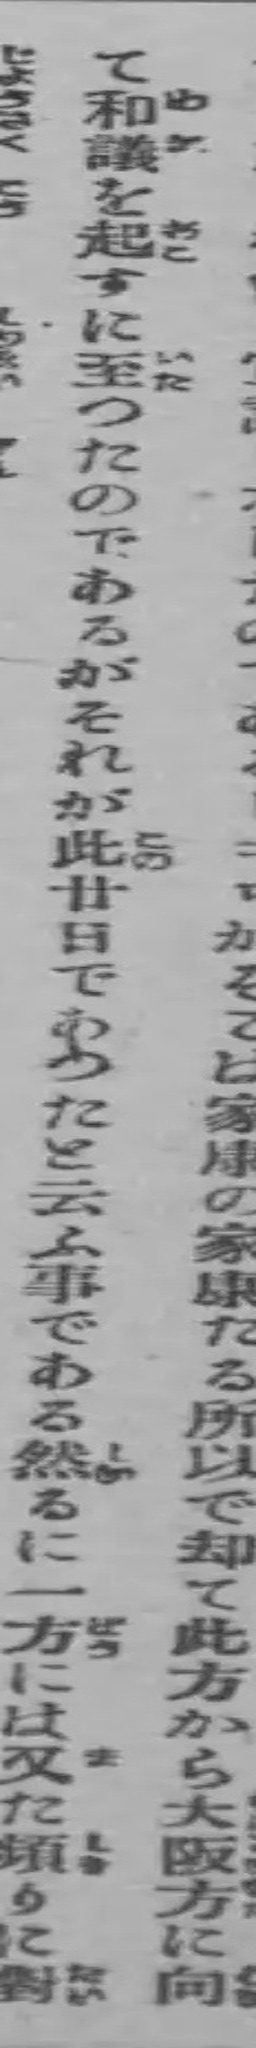て和議を起すに至つたのであるがそれが此廿日であつたと云ふ事である然るに一方には又た頻りに対
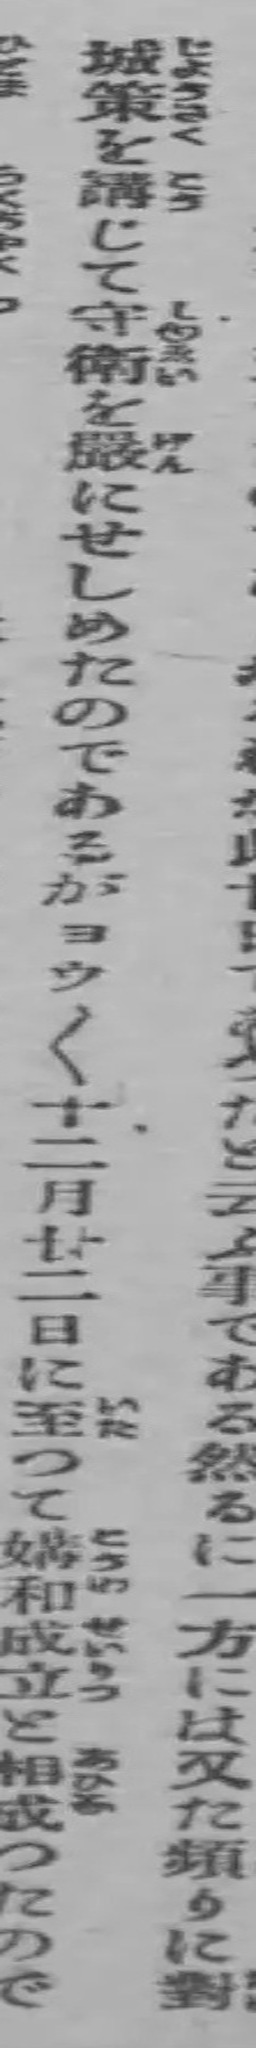和議成る城策を講じて守衛を厳にせしめたのであるがヨウ〳〵十二月廿ニ日に至つて媾和成立と相成つたので
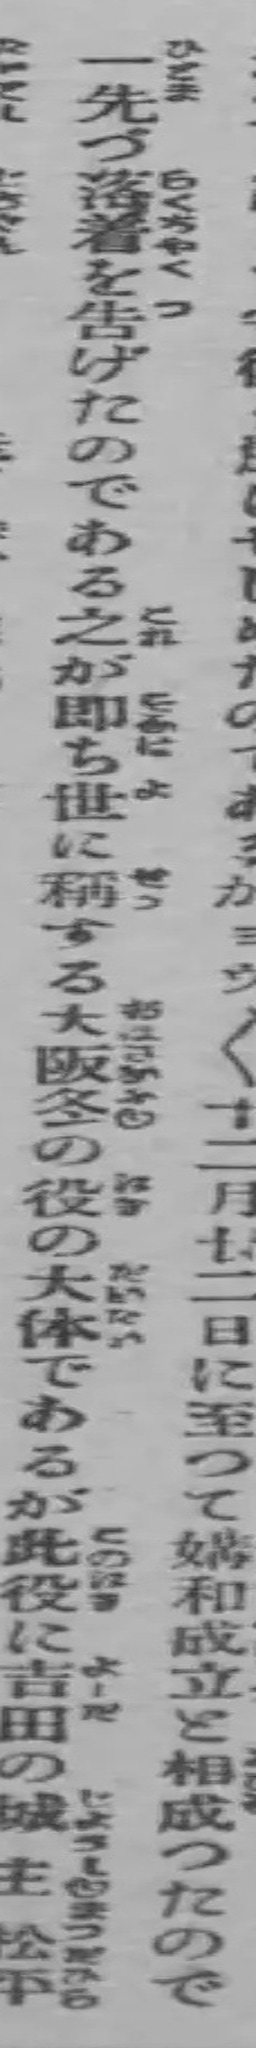忠利の戦功一先づ落着を告げたのである之が即ち世に称する大阪冬の役の大体であるが此役に吉田の城主松平
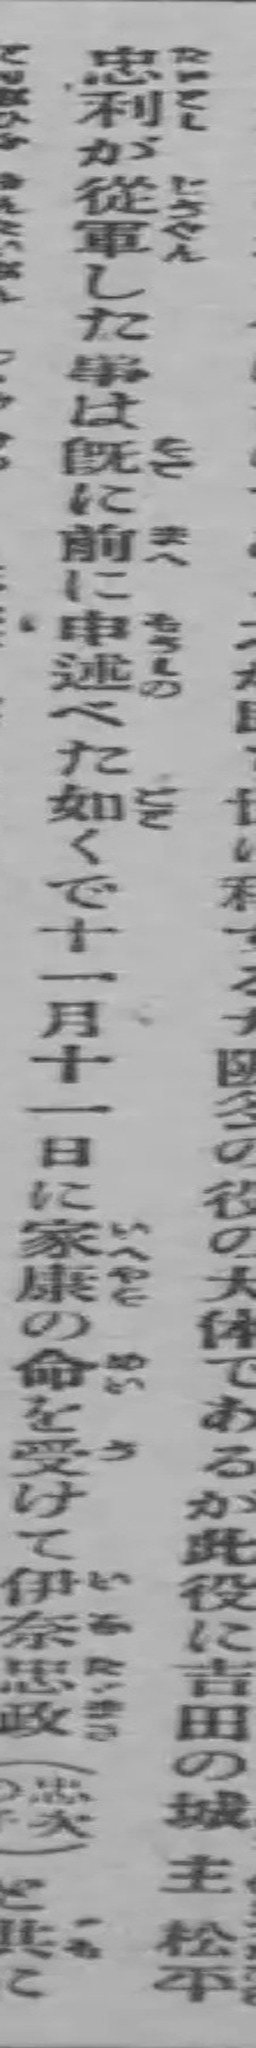忠利が従軍した事は既に前に申述べた如くで十一月十一日に家康の命を受けて伊奈忠政忠次の子と共に
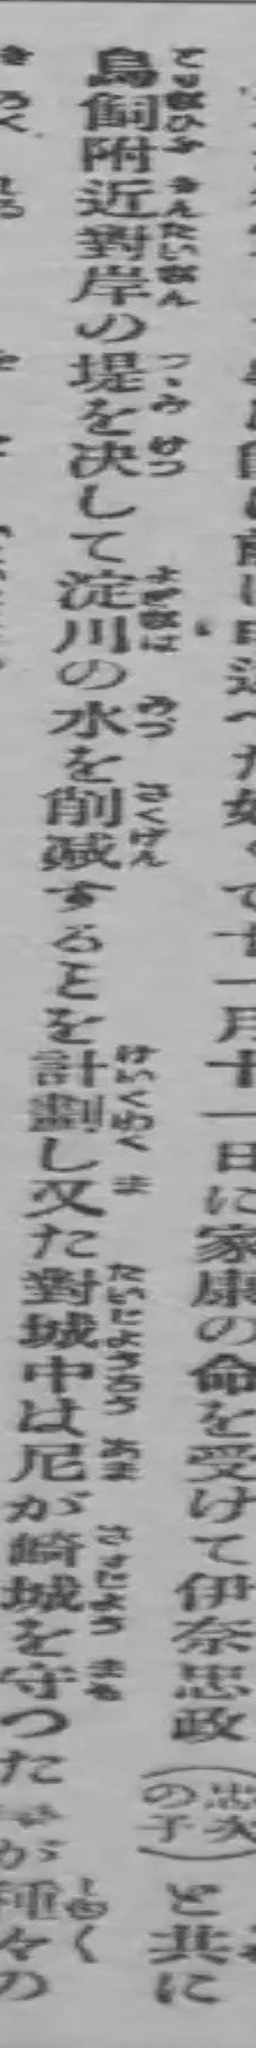鳥飼附近対岸の堤を決して淀川の水を削減することを計劃し又た対城中は尼が崎城を守つた事が種々の
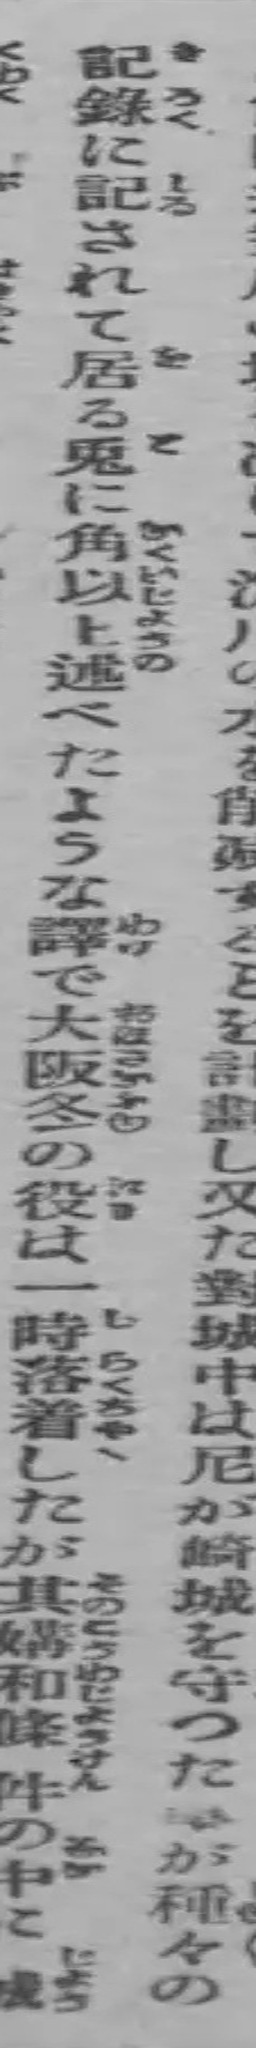記録に記されて居る兎に角以上述べたような訳で大阪冬の役は一時落着したが其媾和条件の中に城
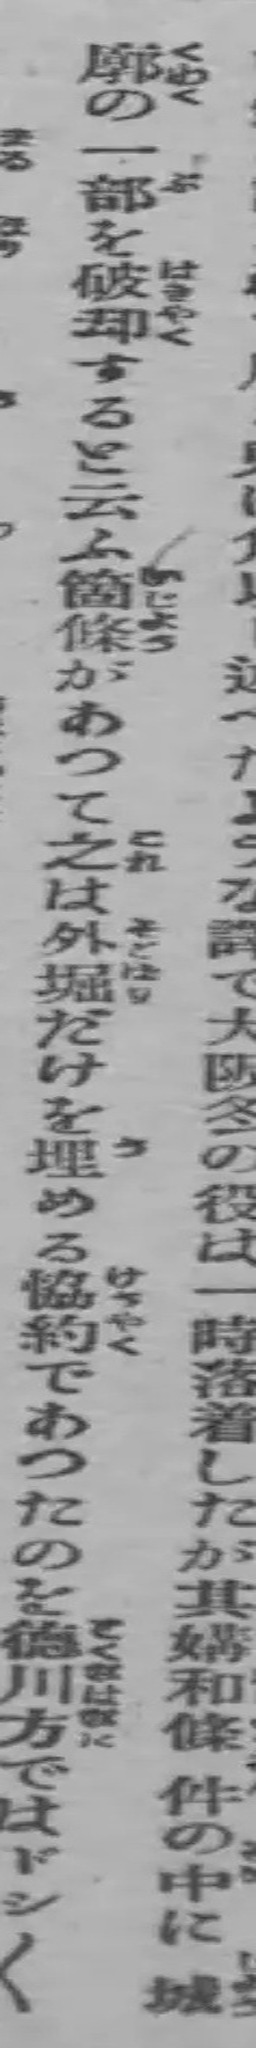廓の一部を破却すると云ふ箇条があつて之は外堀だけを埋める協約であつたのを徳川方ではドシ〳〵
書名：豊橋市史談
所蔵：国立国会図書館 National Diet Library, JAPAN
